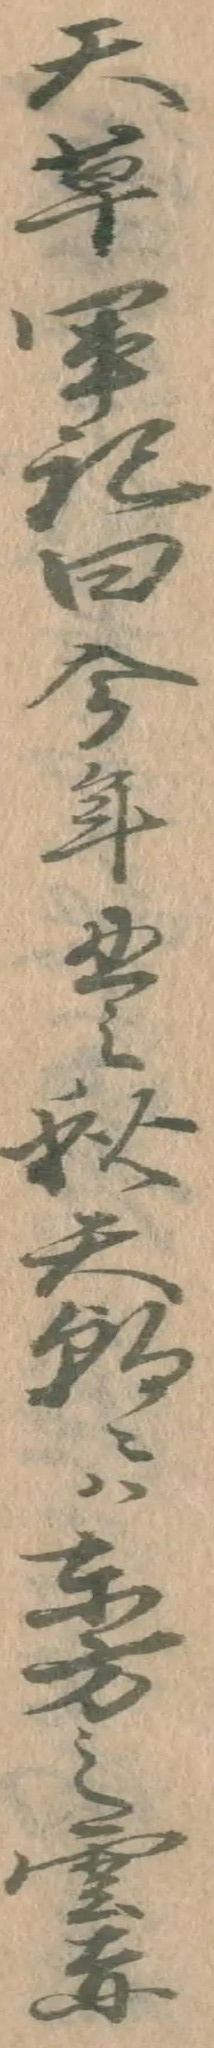天草軍記日今年丑之秋天朝には東方之雲赤
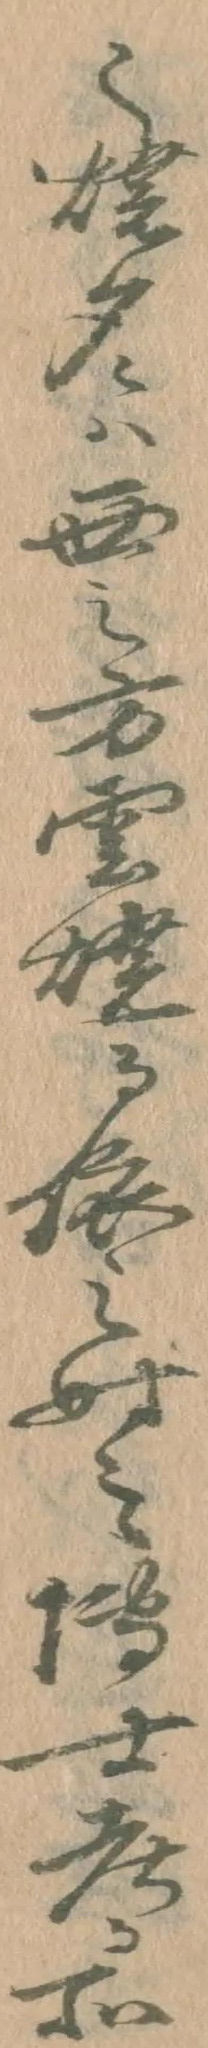く焼夕には西之方雲焼る依之時之博士考る所
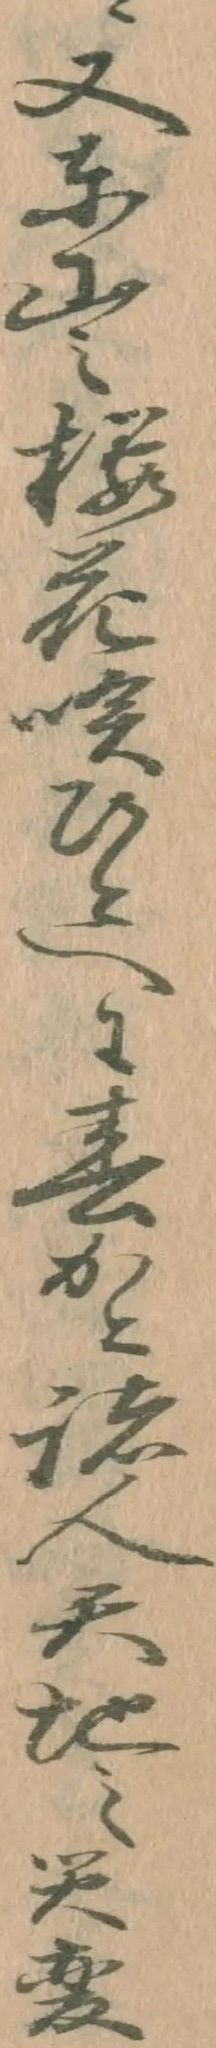に又東山之桜花咲ひとへに春かと諸人天地之災変
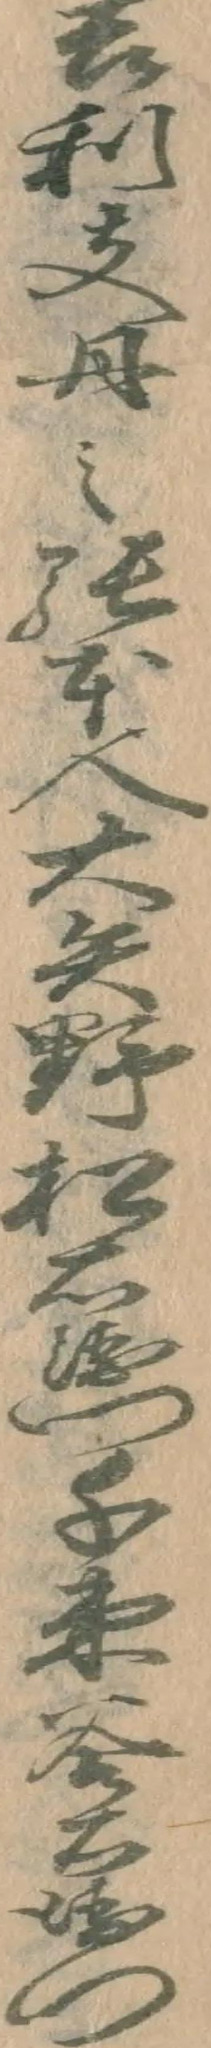吉利支丹之張本人大矢野松右衛門千束善右衛門
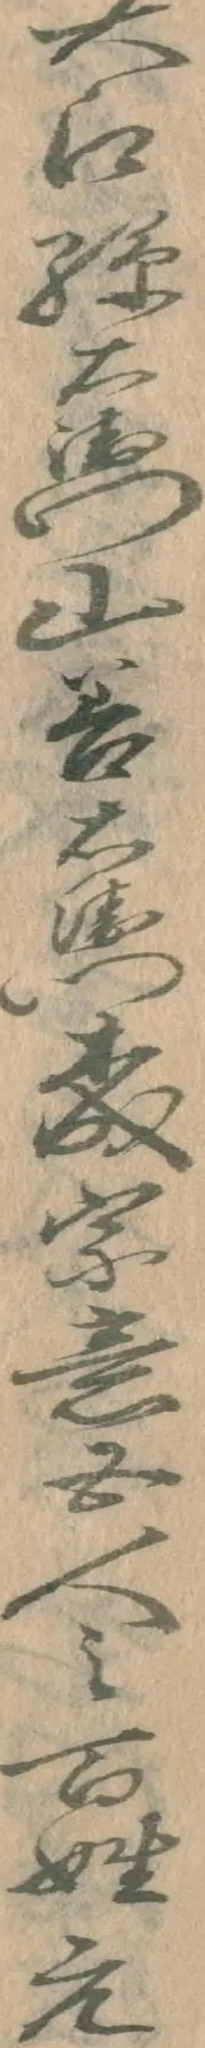大江孫右衛門山善右衛門森宗意五人之百姓元
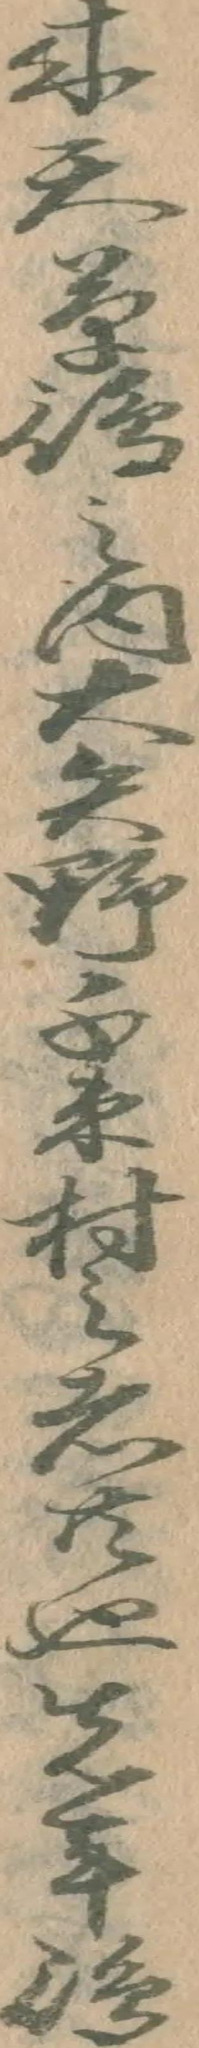来天草島之内大矢野千束村之者共也先年島
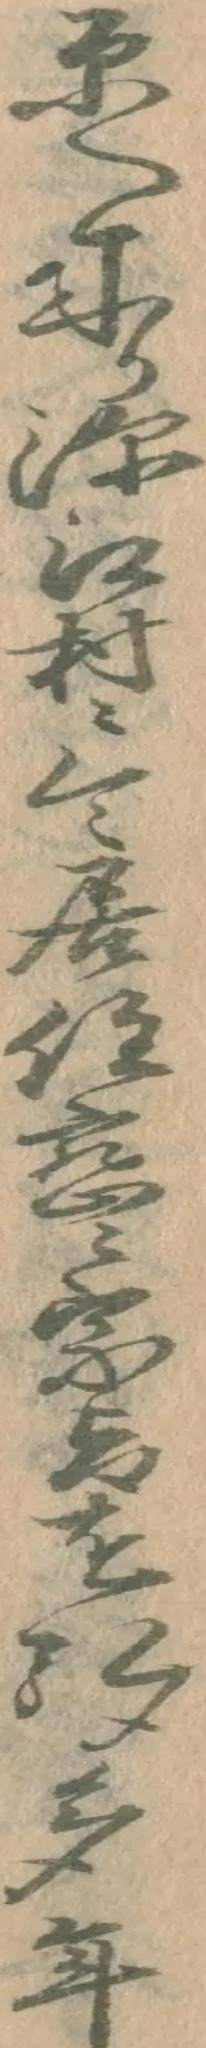原へ来り深江村々今居住密に宗旨を弘め多年
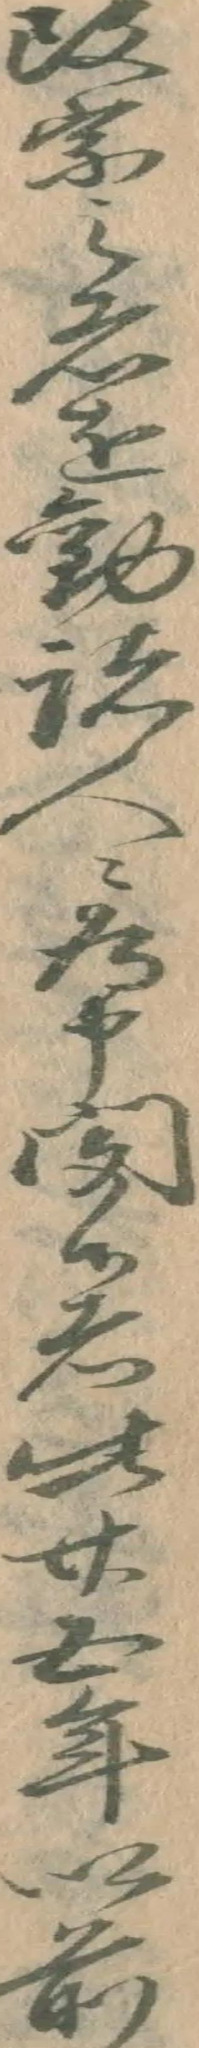改宗之者を勧諸人に為申聞候者比廿五年以前
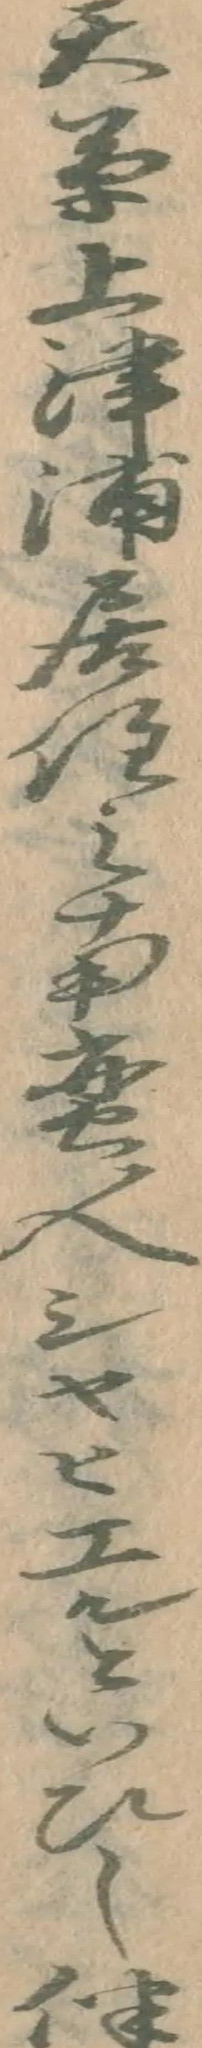天草上津浦居住之南蛮人シヤヒエルといひし伴
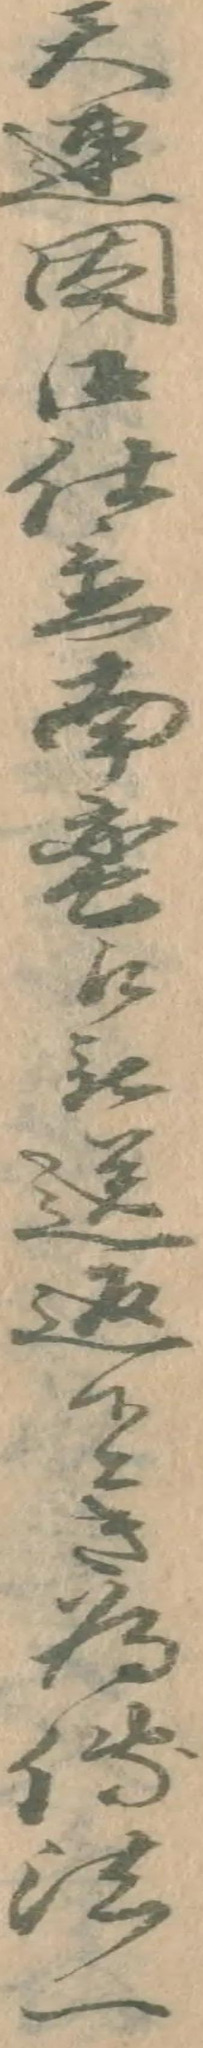天連因御仕置南蛮え被送返候とき為伝法一
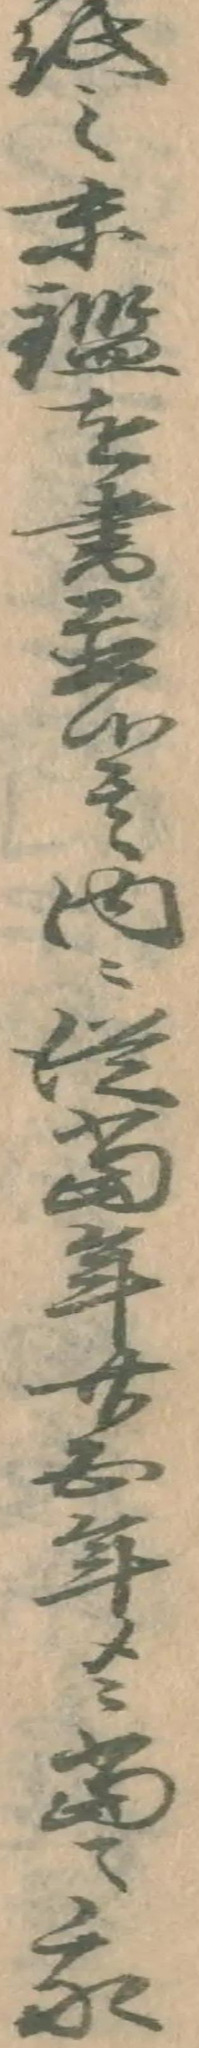紙之末鑑を書置候其内に従当年廿五年めに当て我

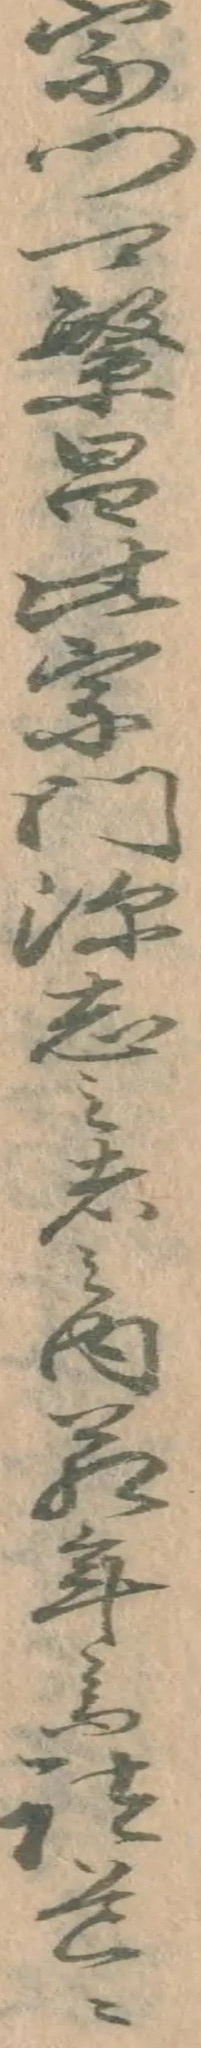宗門可繁昌此宗門深志之者之内若年に而諸道に
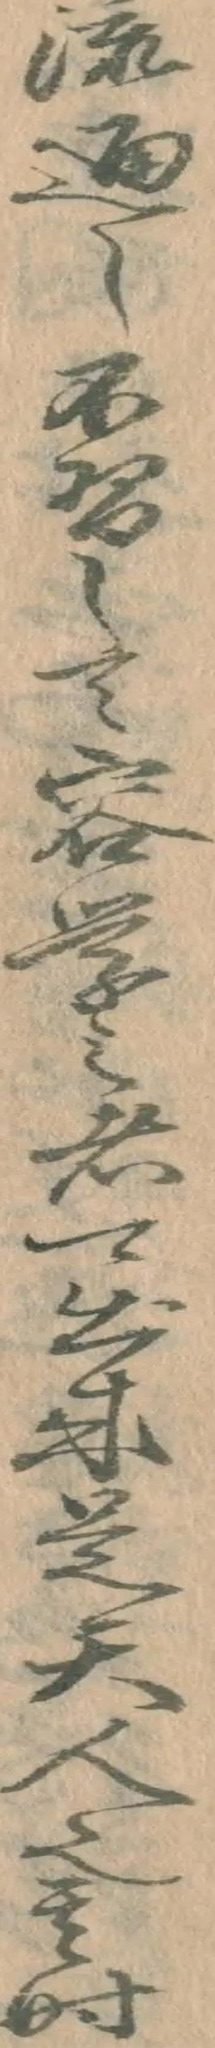流通し不習して容学之者可出来是天人也其時
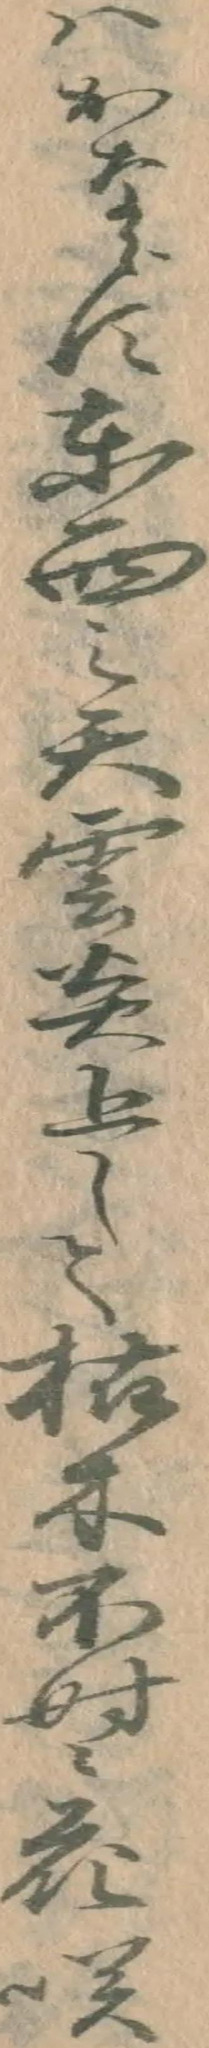はかならす東西之天雲炎上して枯木不時に花咲
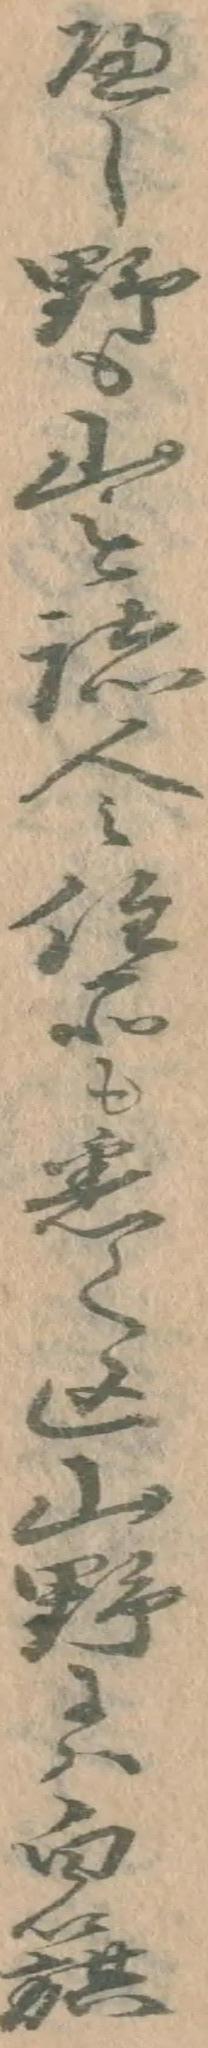へし野も山と諸人之住所も悉く込山野には白い旗
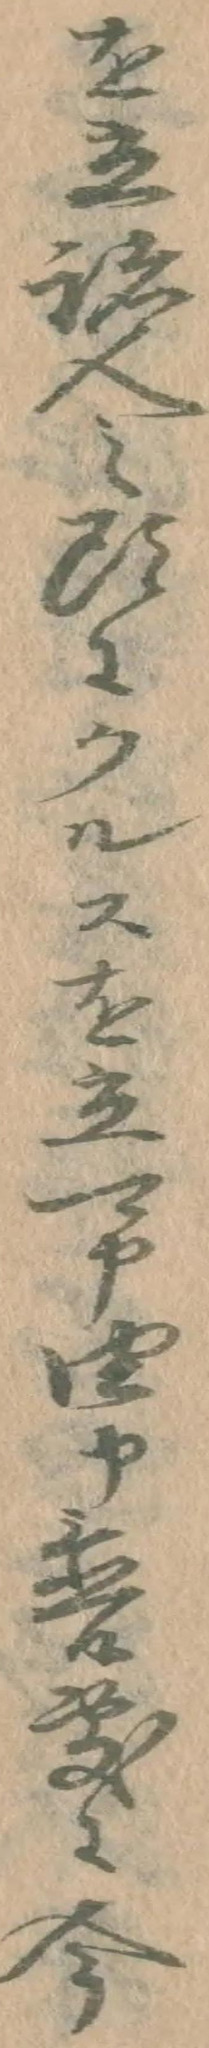を立諸人之頭にクルスを立可申由申置候処に今
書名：切支丹御退治記 49巻. [1]
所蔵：国立国会図書館 National Diet Library, JAPAN
